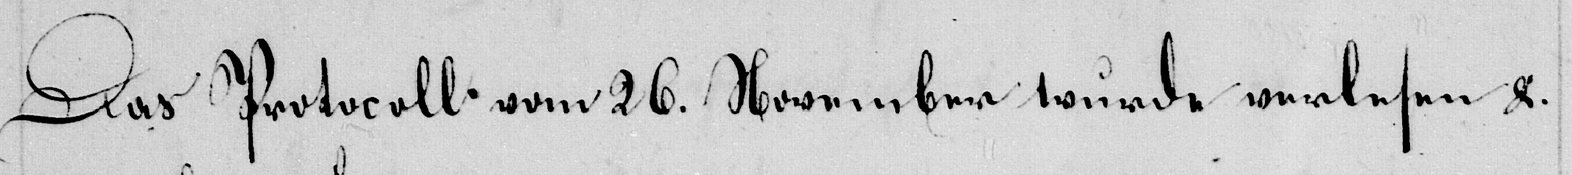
Das Protocoll vom 26. November wurde verlesen &.
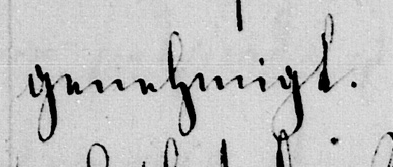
genehmigt.
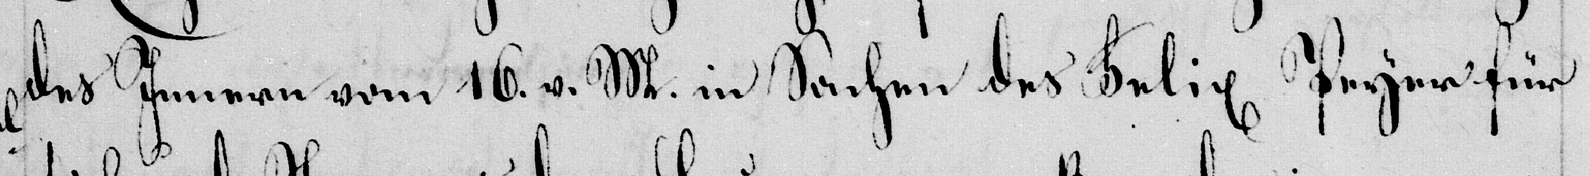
des Innern vom 16. v. M. in Sachen des Felix Peyer für
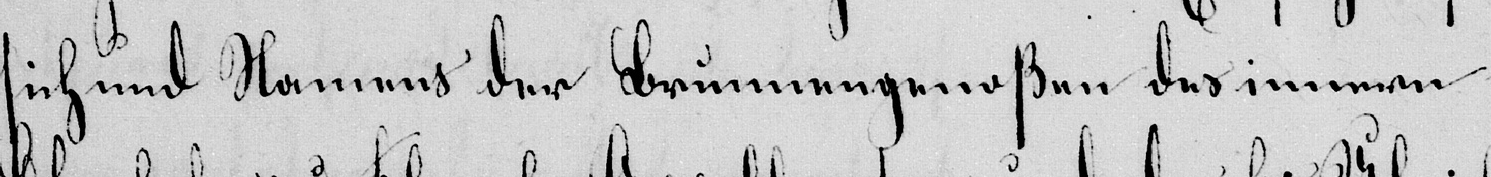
sich und Namens der Brunnengenoßen des innern
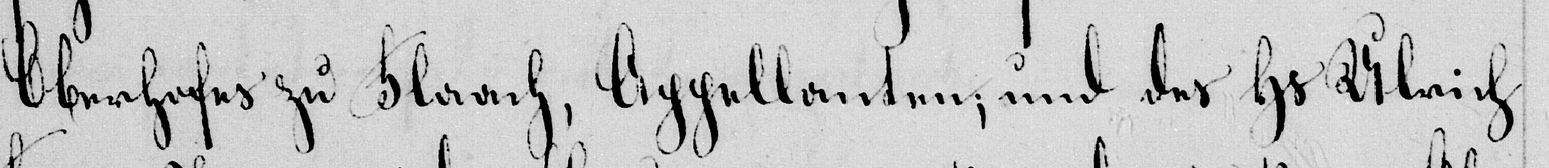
Oberhofes zu Flaach, Appellanten; und des Hs. Ulrich
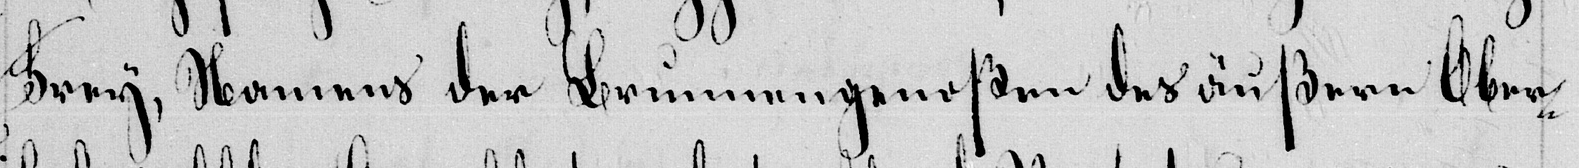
Frey, Namens der Brunnengenoßen des äußern Ober¬
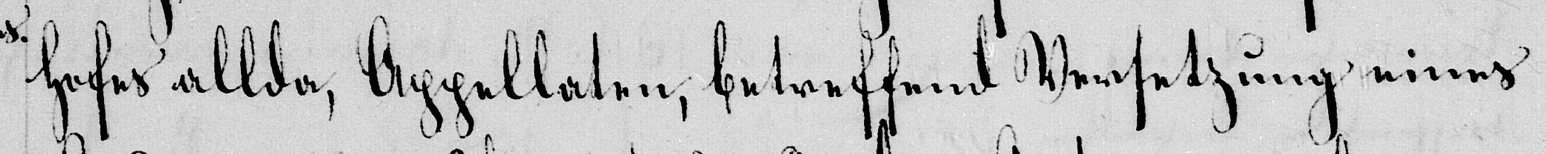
hofes allda, Appellaten, betreffend Versetzung eines
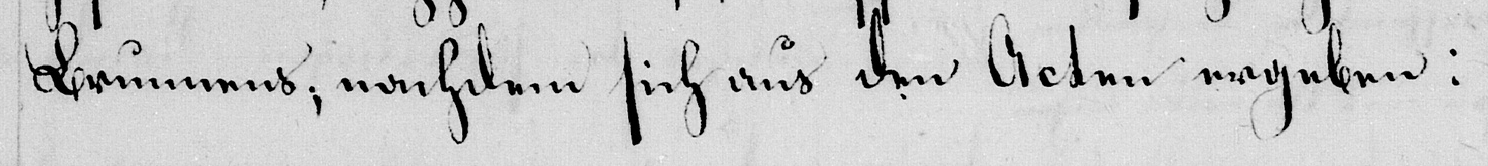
Brunnens, nachdem sich aus den Acten ergeben:
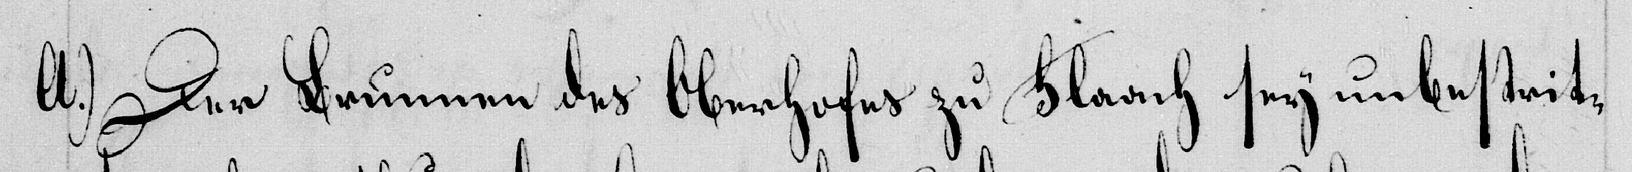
A.) Der Brunnen des Oberhofes zu Flaach sey unbestrit¬
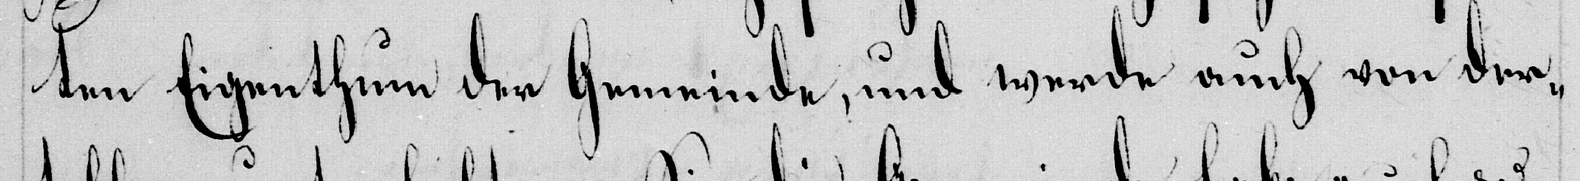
ten Eigenthum der Gemeinde, und werde auch von der¬
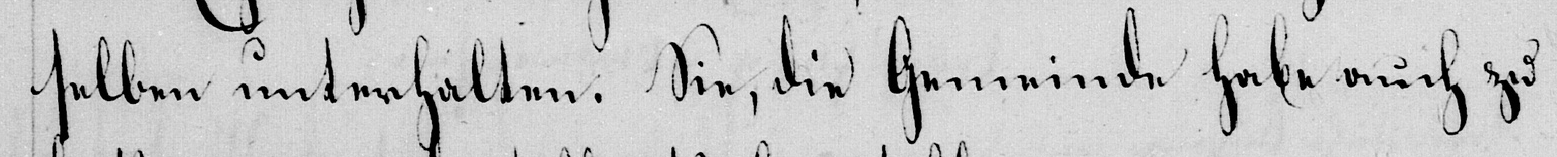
selben unterhalten. Sie, die Gemeinde habe auch zu
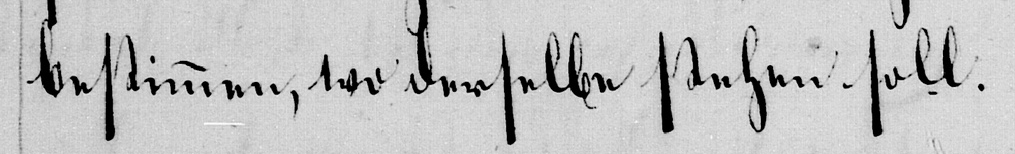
bestimmen, wo derselbe stehen soll.
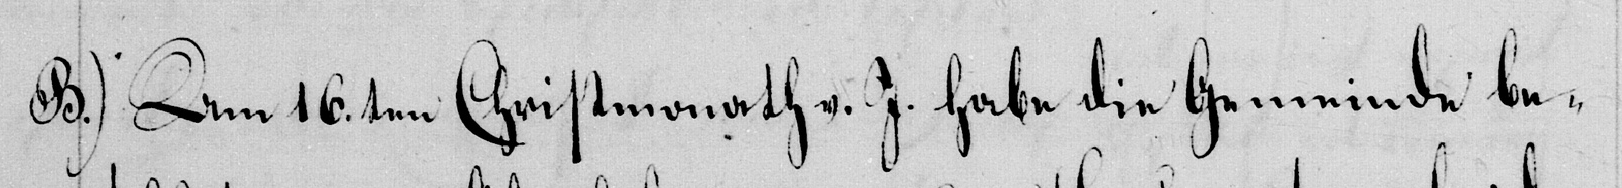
B.) Am 16.ten Christmonath v. J. habe die Gemeinde be¬
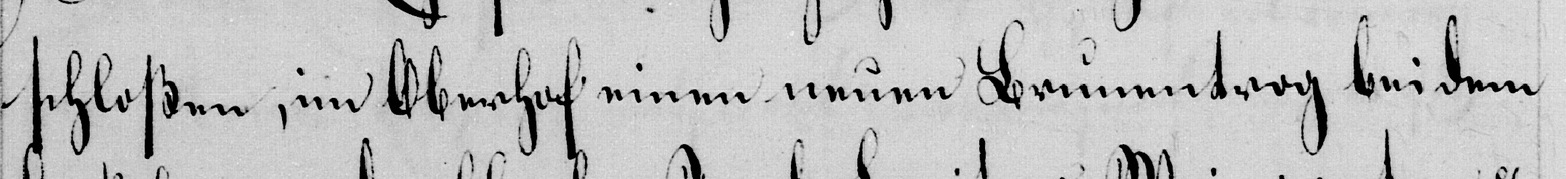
schloßen, im Oberhof einen neuen Brunnentrog bei dem
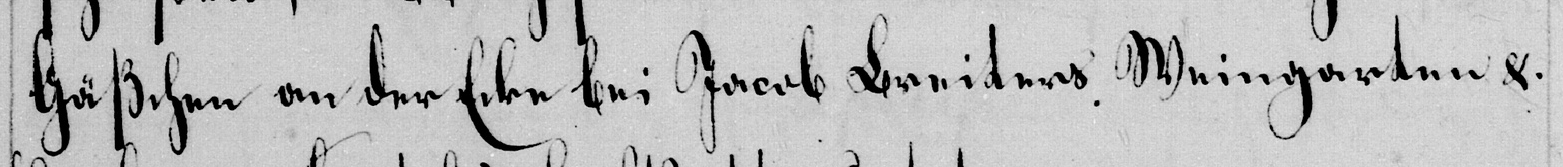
Gäßchen an der Ecke bei Jacob Breiters Weingarten &.
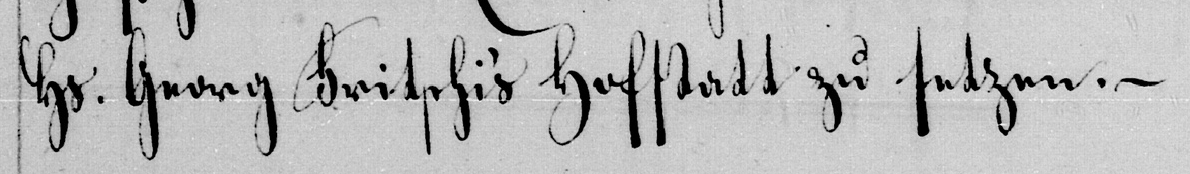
Hs. Georg Fritschi’s Hofstatt zu setzen.
